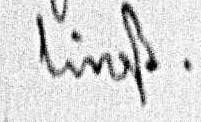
ließ.
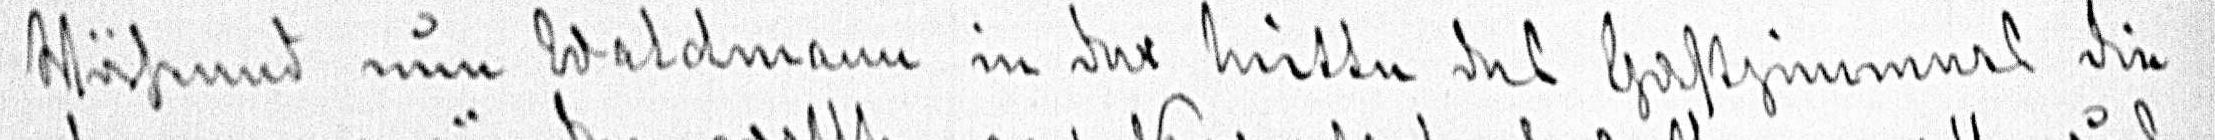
Während nun Waldmann in der Mitte des Gastzimmers die
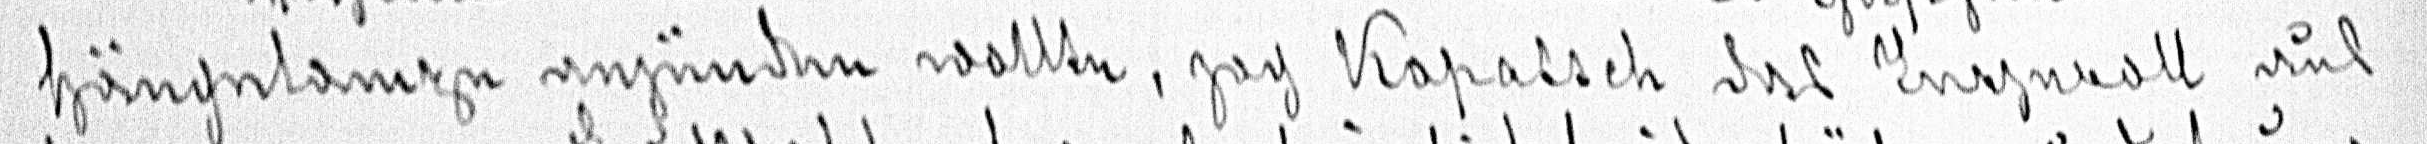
Hängelampe anzünden wollte, zog Kopatsch das Terzeroll aus
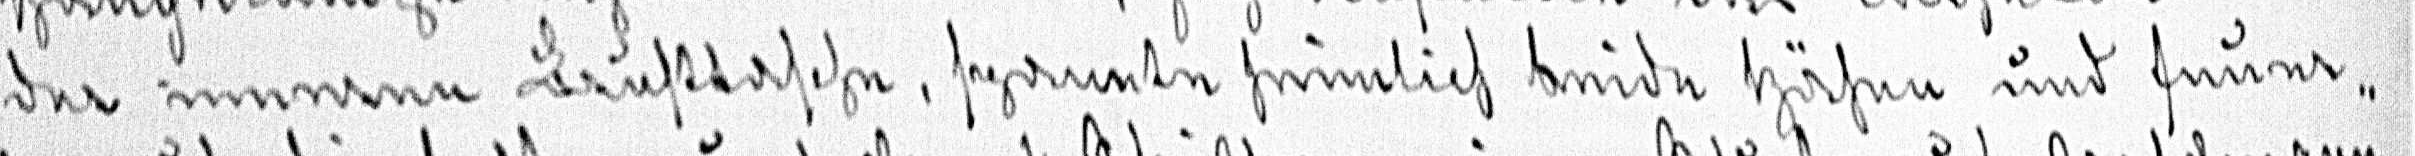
der inneren Brusttasche, spannte heimlich beide Bähne und feuer¬
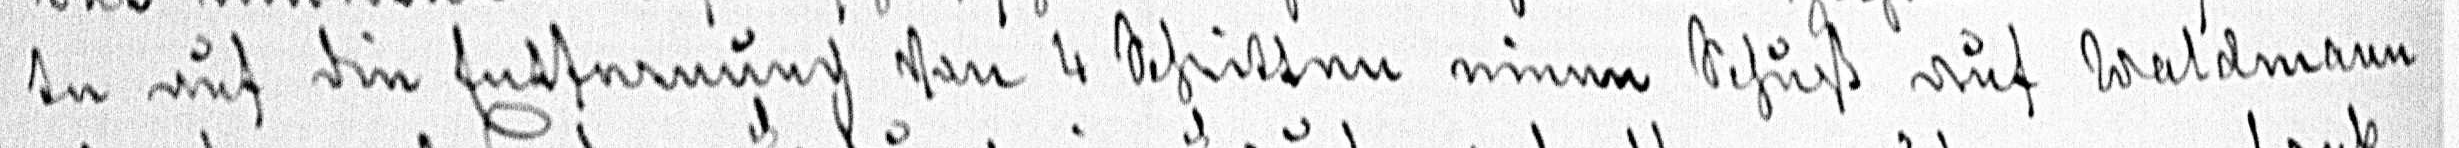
te auf die Entfernung von 4 Schriften einen Schuß auf Waldmann
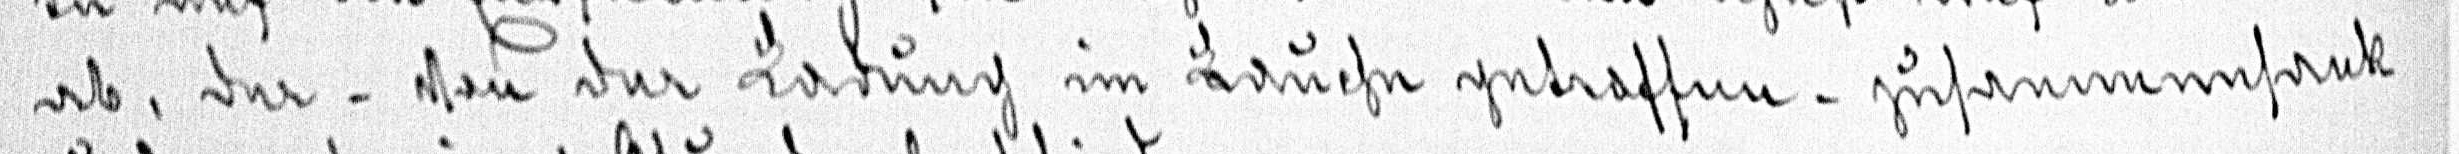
ab, der – von der Ladung im Bauche getroffen – zusammensank
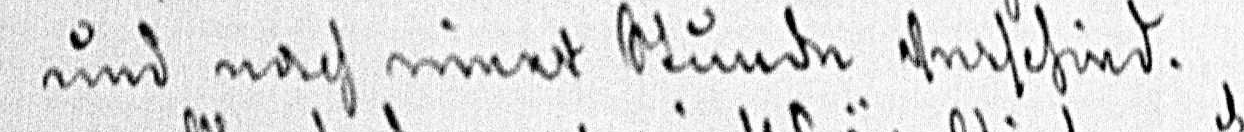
und nach einer Stunde verschied.
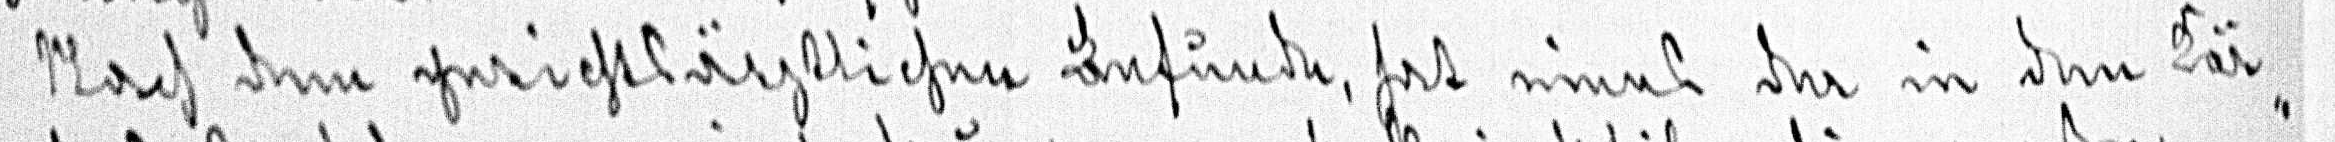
Nach dem gerichtsärztlichen Befunde, hat eines der in den Kör¬
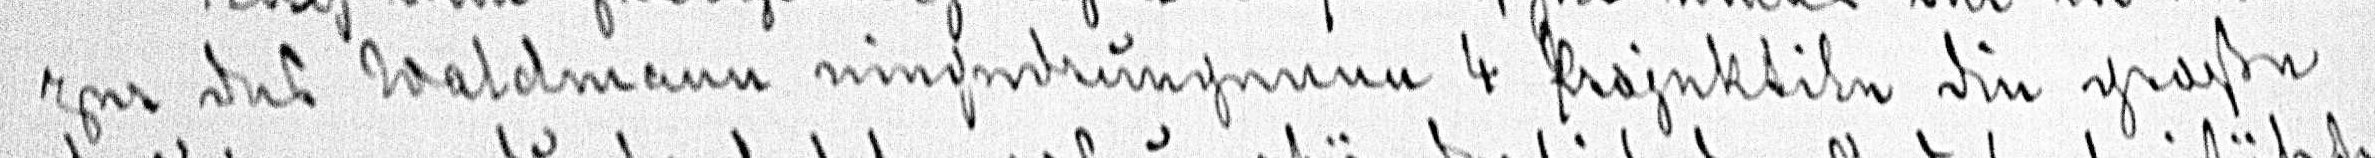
pers des Waldmann eingedrungenen 4 Projektile die große
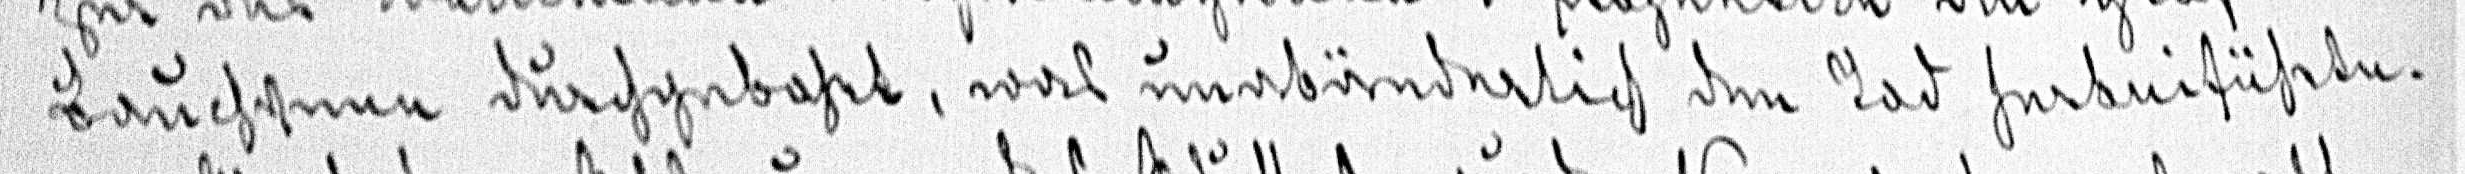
Bauchvene durchgebohrt, was unabänderlich den Tod herbeiführte.
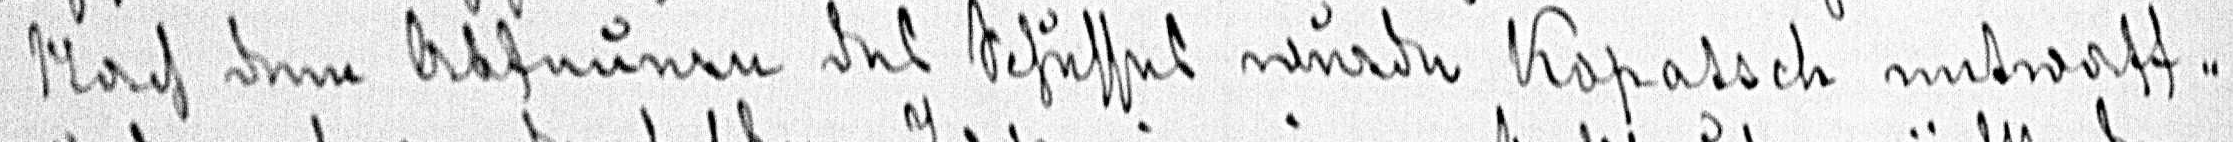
Nach dem Abfeuern des Schusses wurde Kopatsch entwaff¬
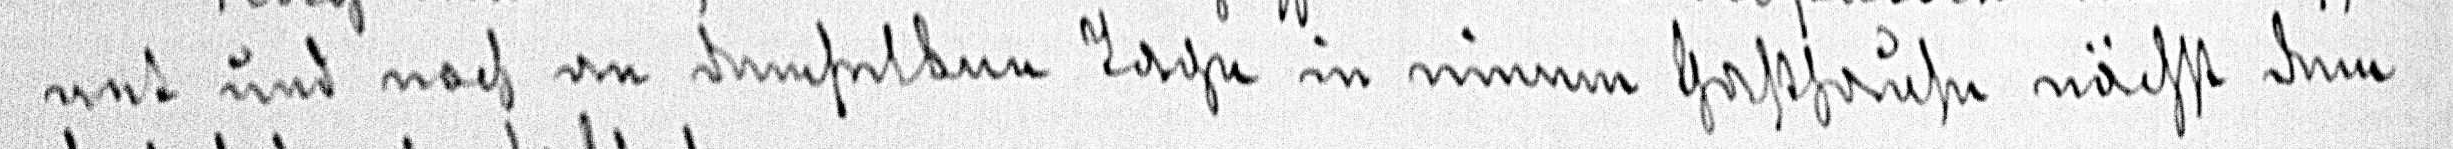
net und noch an demselben Tage in einem Gasthause nächst dem
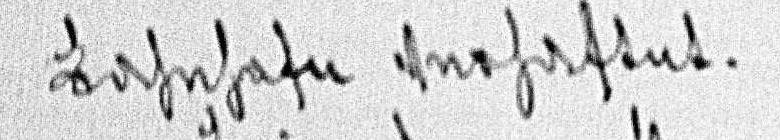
Bahnhofe verhaftet.
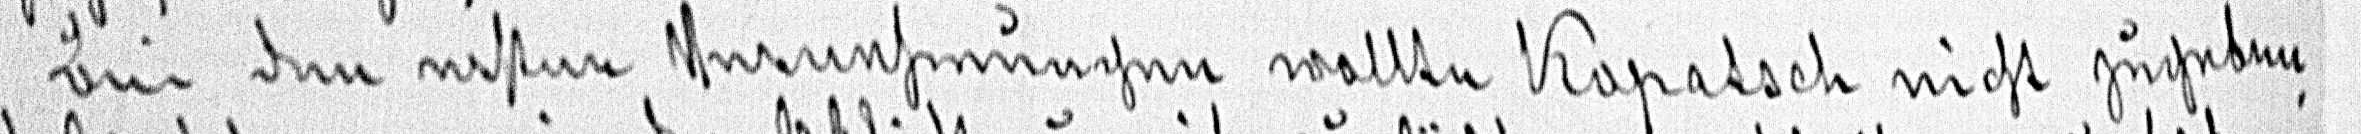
Bei den ersten Vernehmungen wollte Kopatsch nicht zugeben
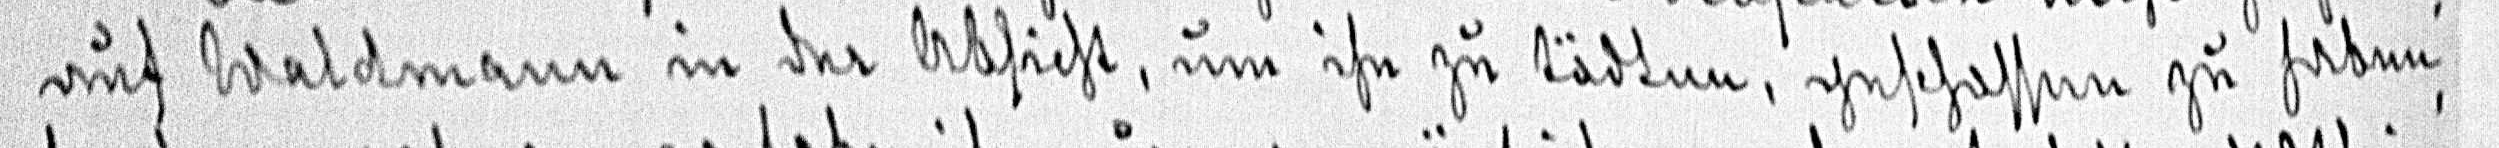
auf Waldmann in der Absicht, um ihn zu tödten, geschossen zu haben
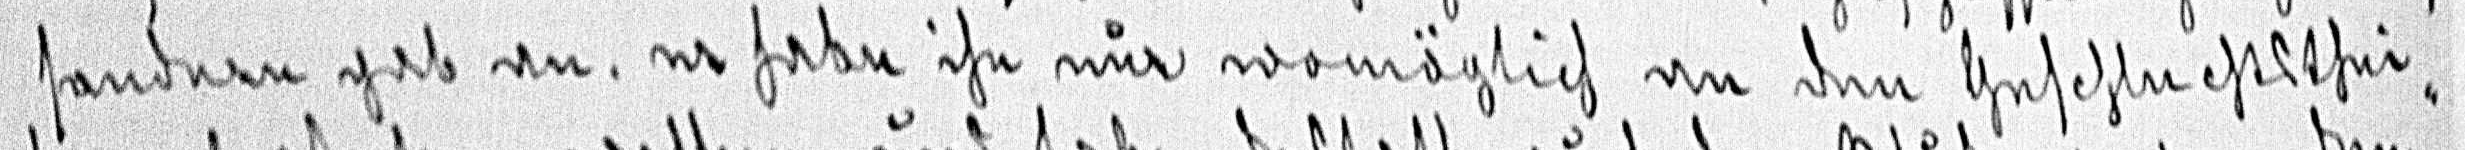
sondern gab an, er habe ihn nur womöglich an den Geschlechtsthei¬
